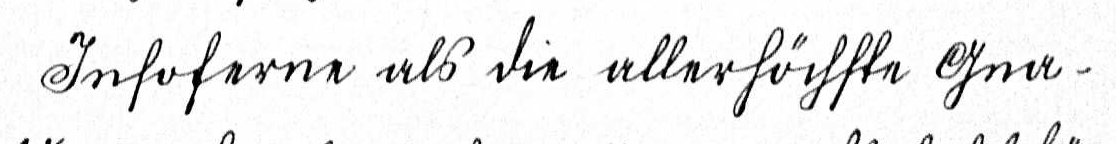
Insofern als die allerhöchste Gna¬
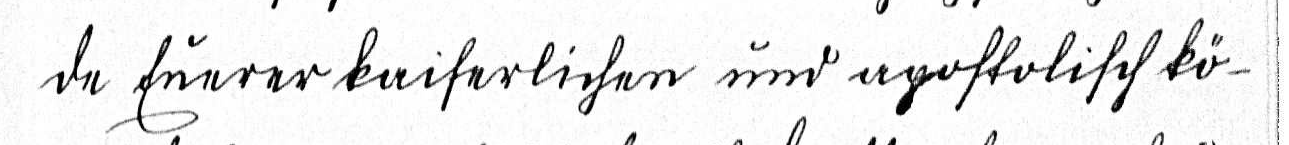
de Euerer kaiserlichen und apostolisch kö¬
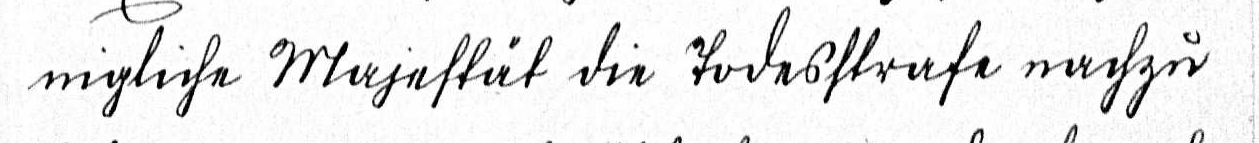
nigliche Majestät die Todesstrafe nachzu
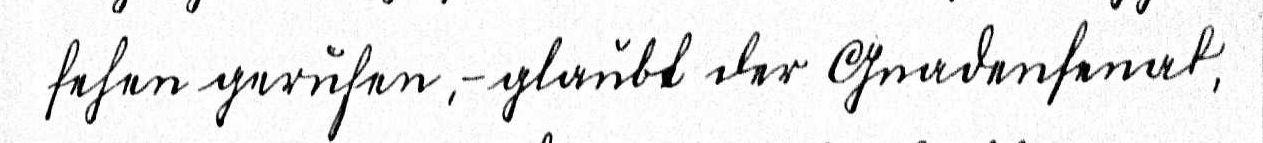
sehen geruhen, – glaubt der Gnadensenat,
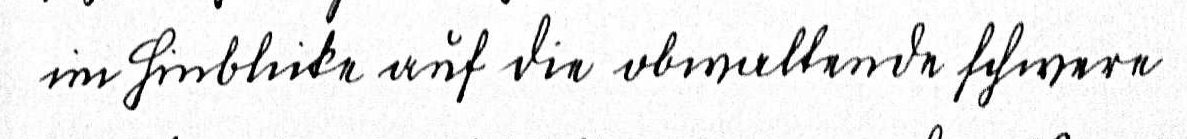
im Hinblicke auf die obwallende schwere
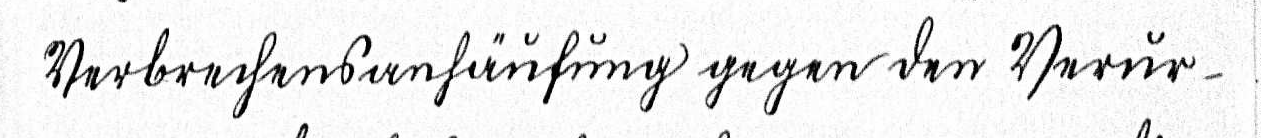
Verbrechensanhäufung gegen den Verur¬
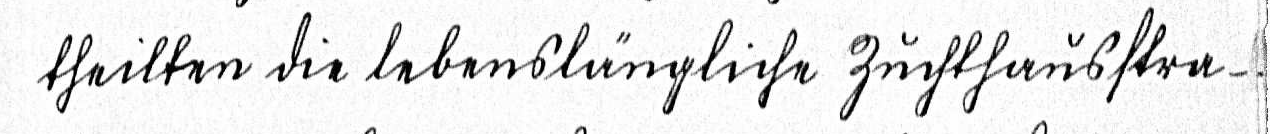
theilten die lebenslängliche Zuchthausstra¬
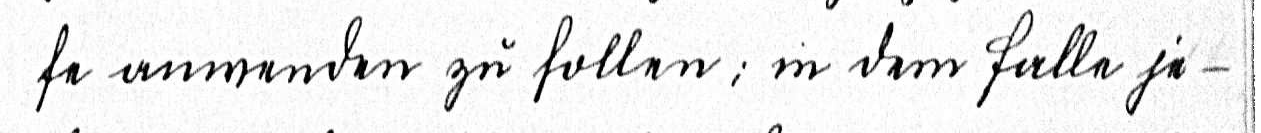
fe anwenden zu sollen; in dem Falle je¬
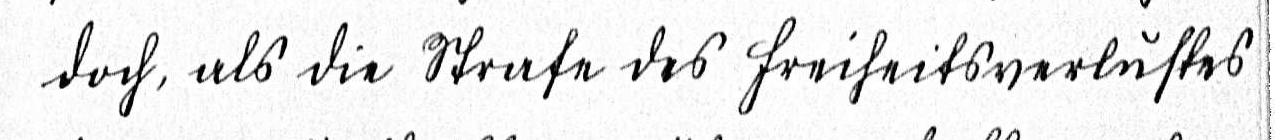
doch, als die Strafe des Freiheitsverlustes
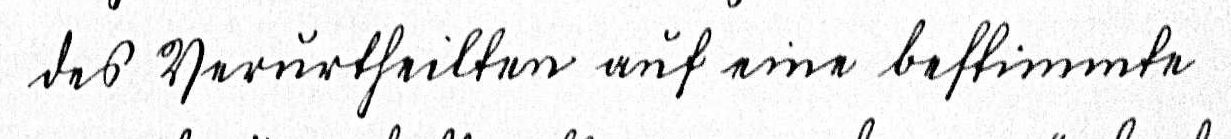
des Verurtheilten auf eine bestimmte
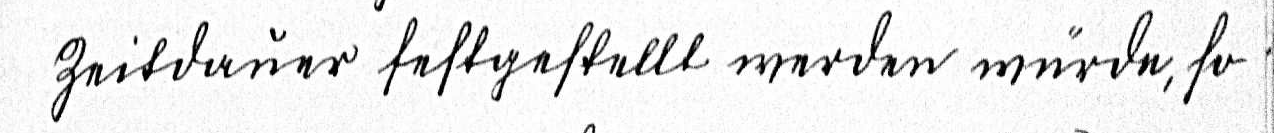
Zeitdauer fetgestellt werden würde, so¬
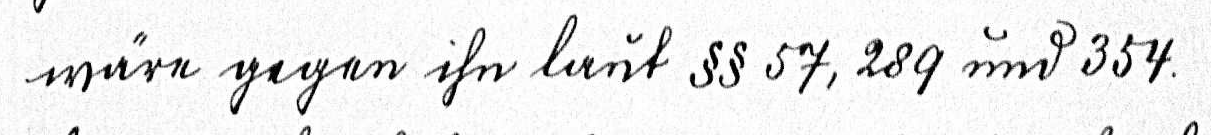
wäre gegen ihn laut §§ 57, 289 und 354.
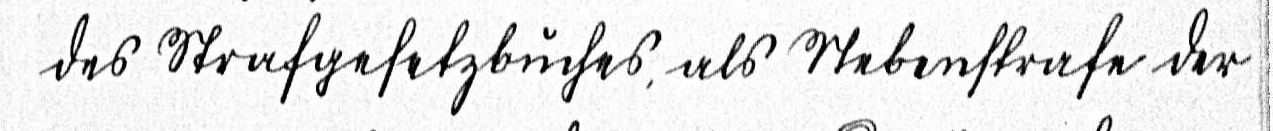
des Strafgesetzbuches, als Nebenstrafe der
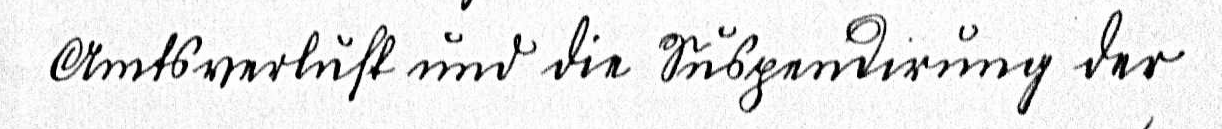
Amtsverlust und die Suspendirung der
